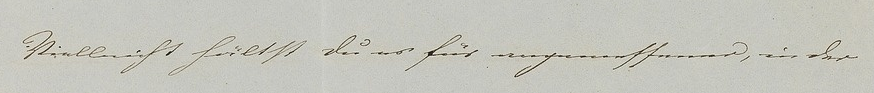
Vielleicht hältst du es für angemessener, in der
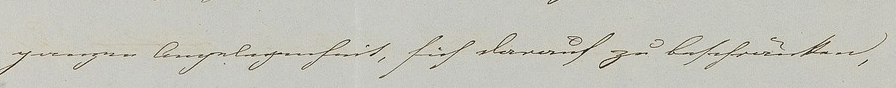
ganzen Angelegenheit, sich darauf zu beschränken,
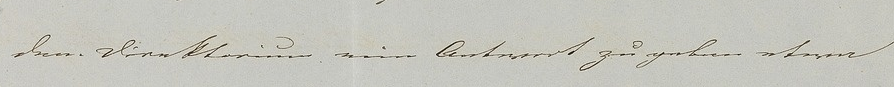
dem Direktorium eine Antwort zu geben etwa
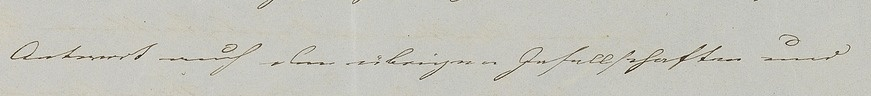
Antwort auch den übrigen Gesellschaften und
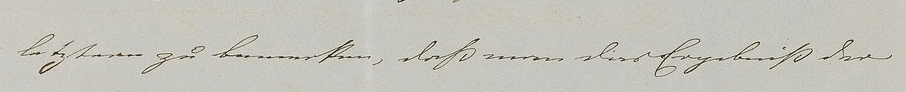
letztern zu bemerken, daß man das Ergebniß der
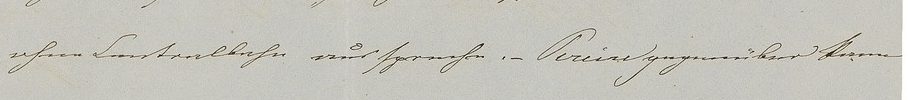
ohne Centralbahn ausspreche. – Pereire gegenüber kann
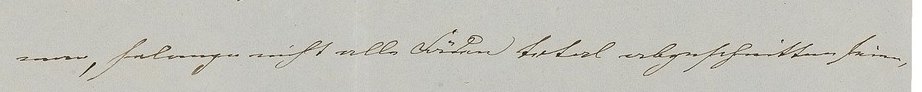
man, solange nicht alle Fäden total abgeschnitten seien,
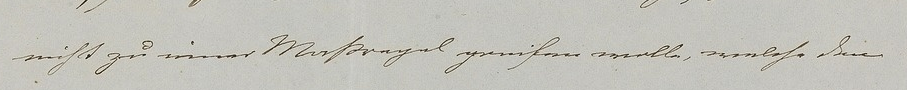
nicht zu einer Maßregel greifen wolle, welche den
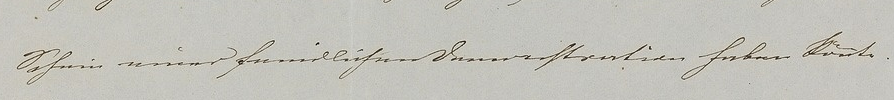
Schein einer feindlichen Demonstration haben könnte.
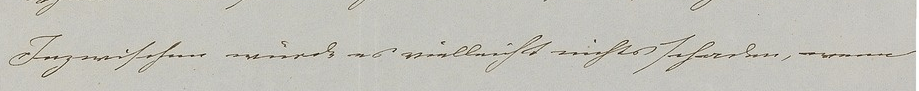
Inzwischen würde es vielleicht nichts schaden, wenn
